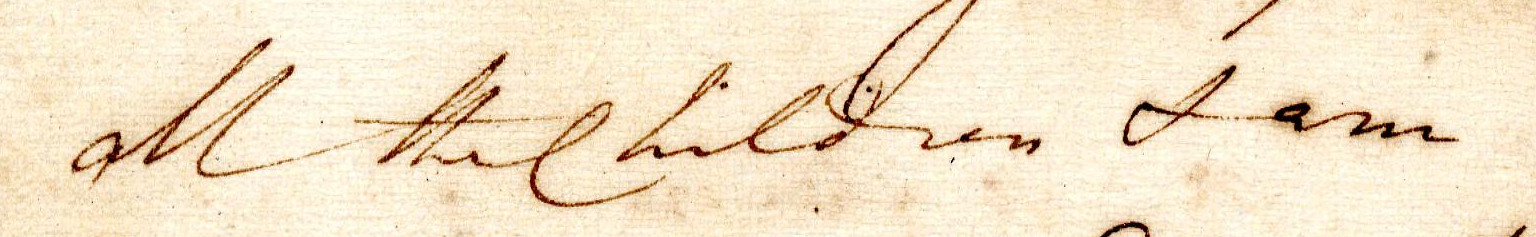all the Children I am
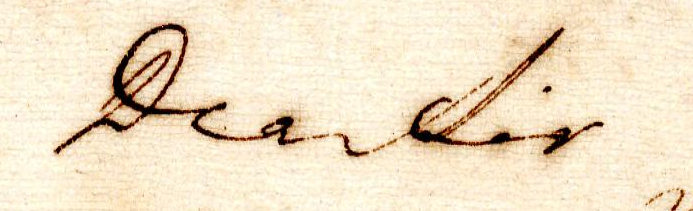Dear Sir
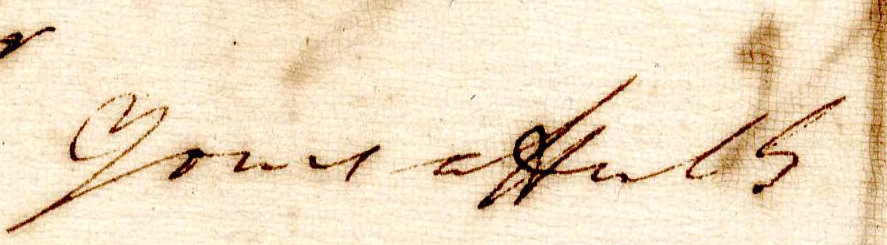Your affect^e
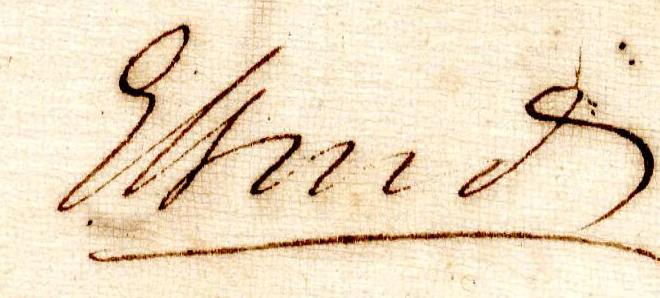Ed. Burd
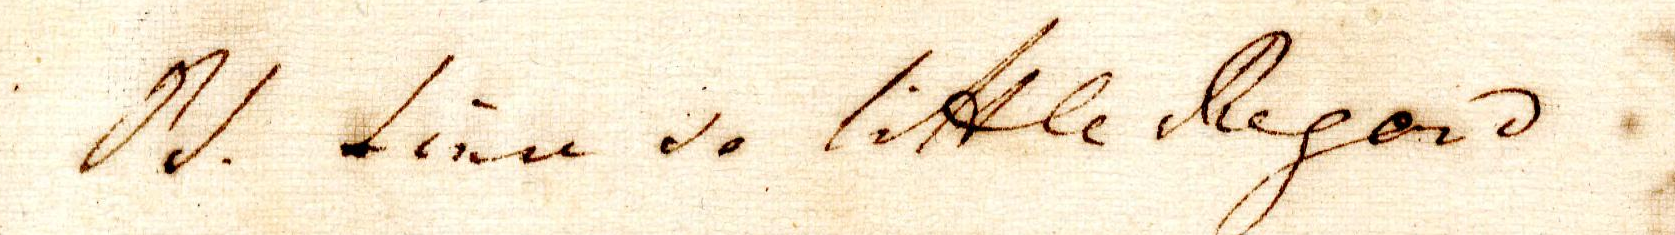PS. Since so little Regard
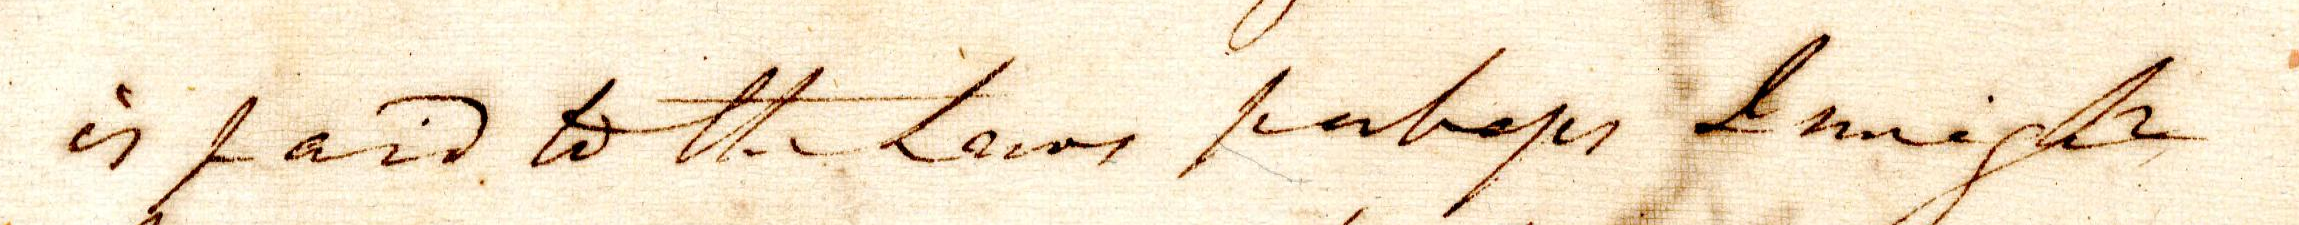is paid to the Laws perhaps I might
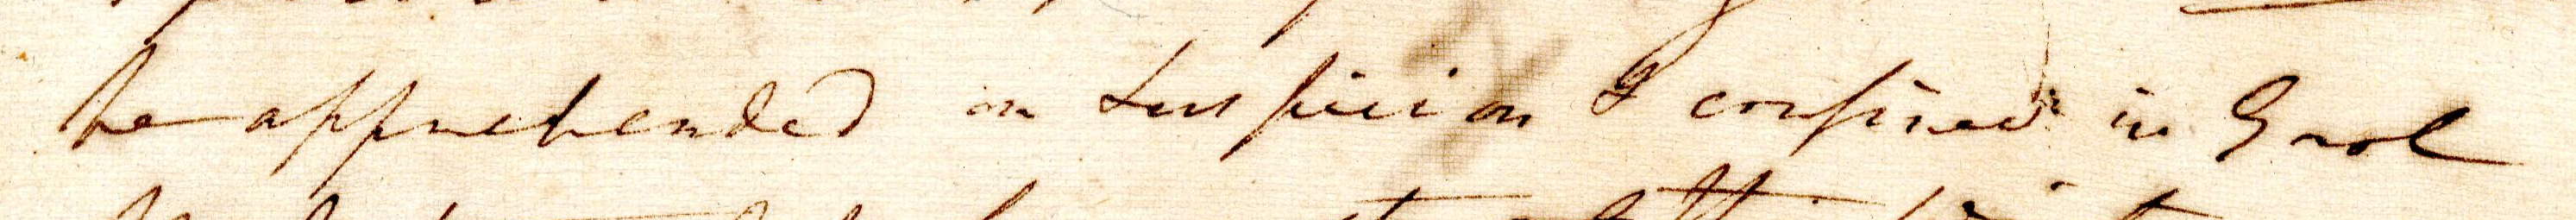be apprehended on Suspicion & confined in Gaol
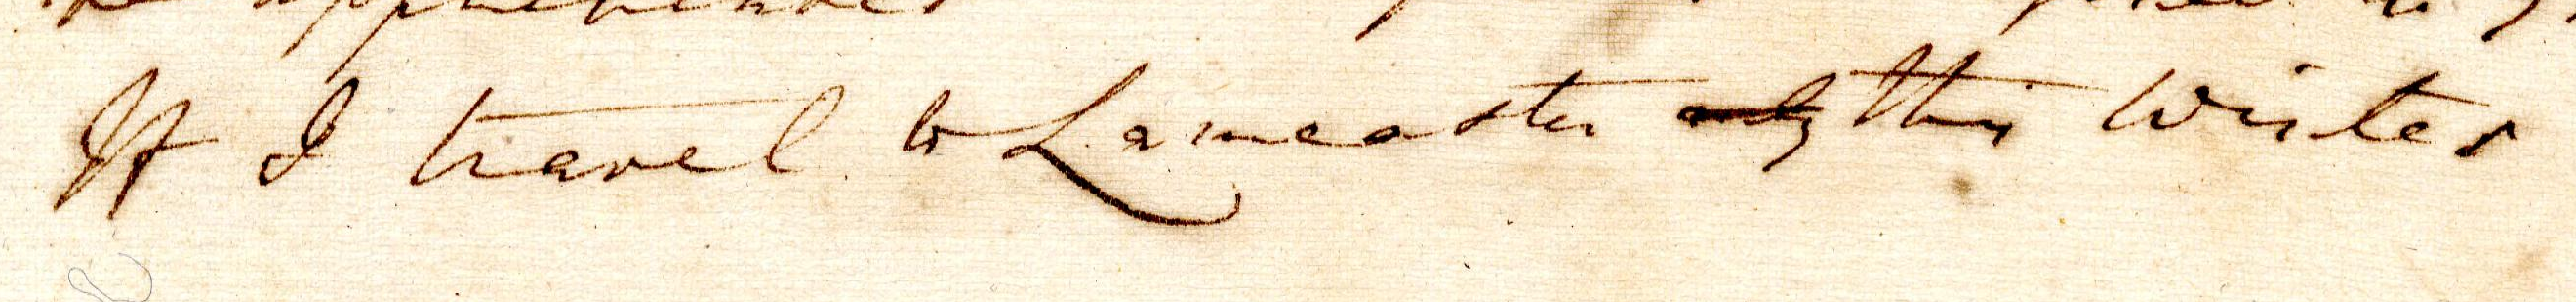If I travel to Lancaster [___] this winter
